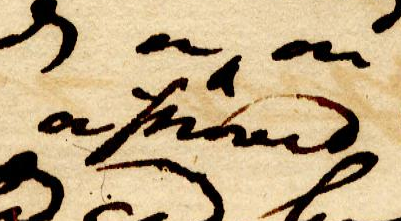a friend
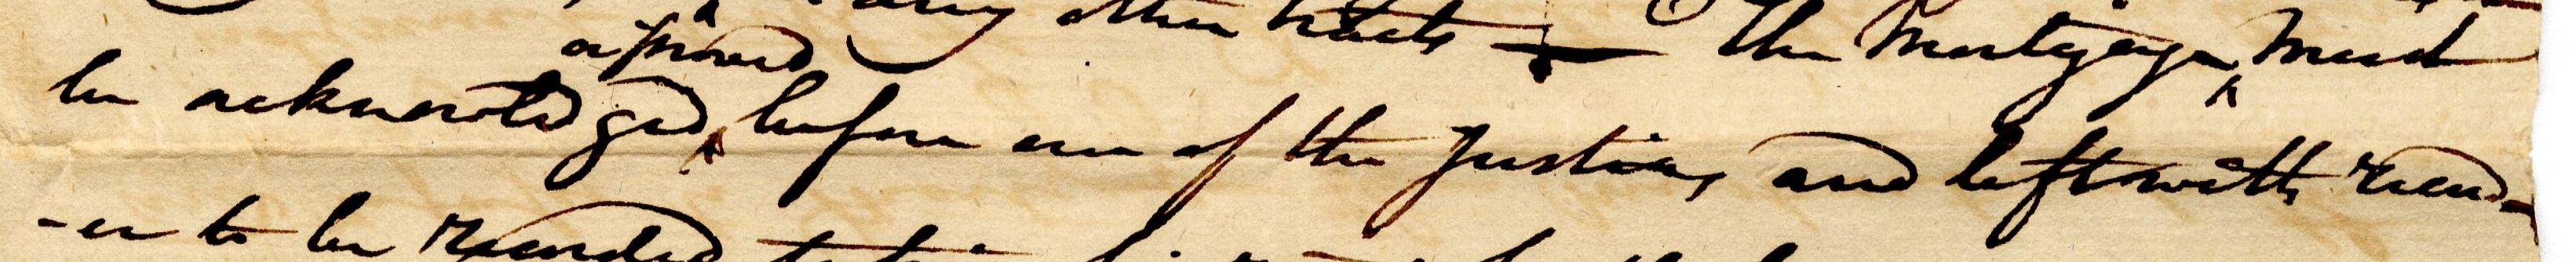be acknowledged ^ before one of the justices and left with riend-
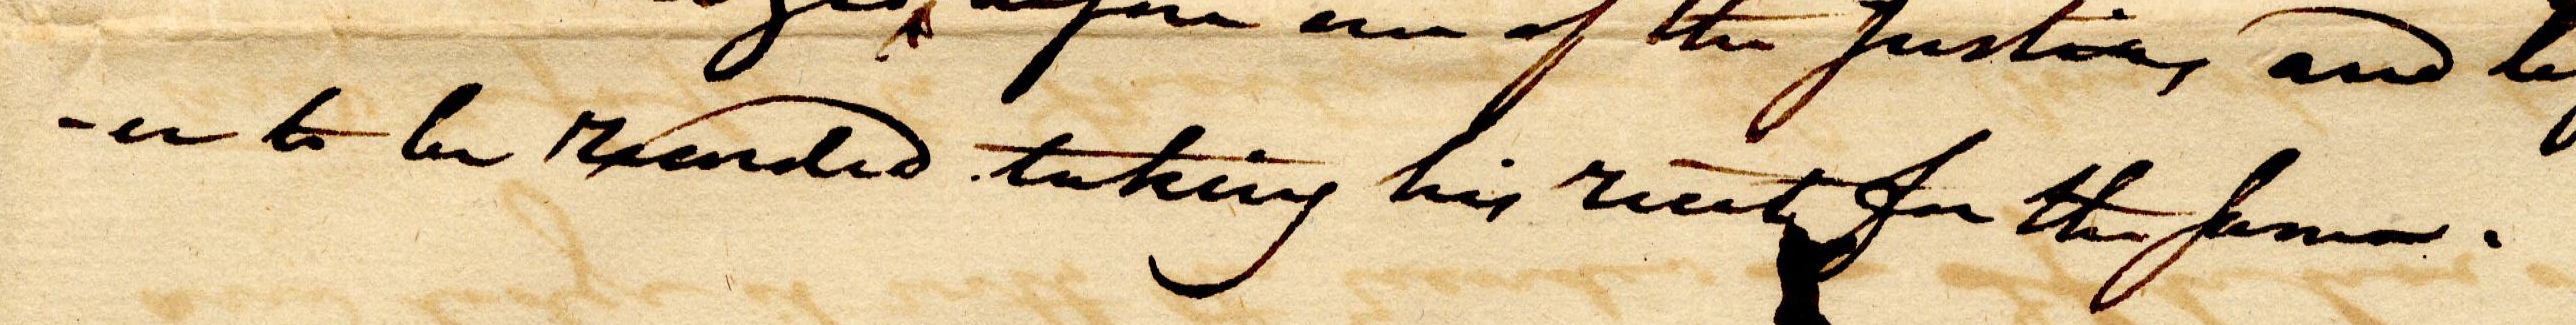-er to be recorded taking his recit for the same.
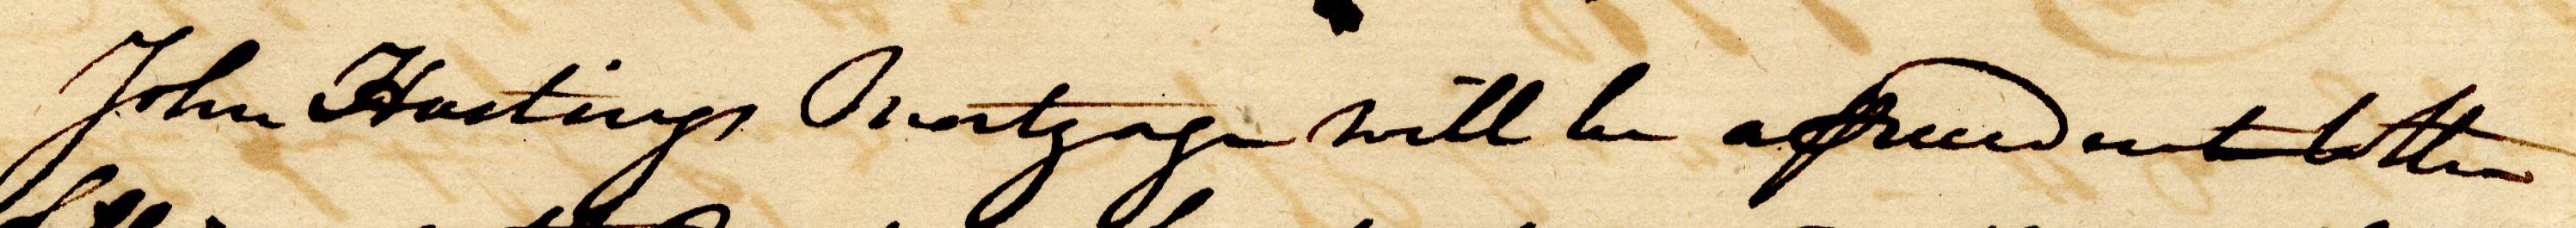John Hastings mortgage will be apereced out to them
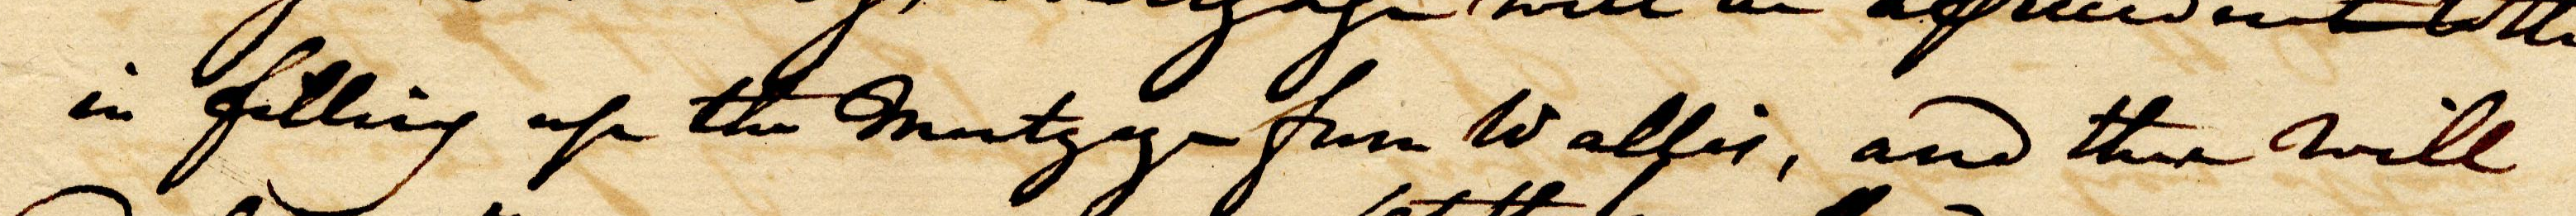in filling up the mortgage from Wallis, and thee will
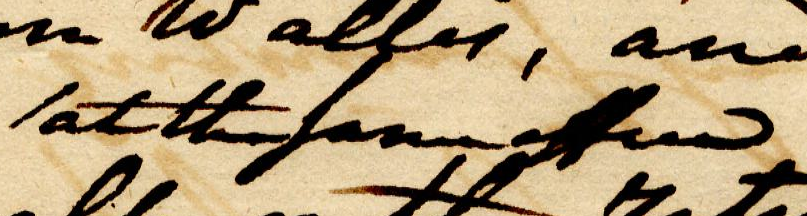at the same office
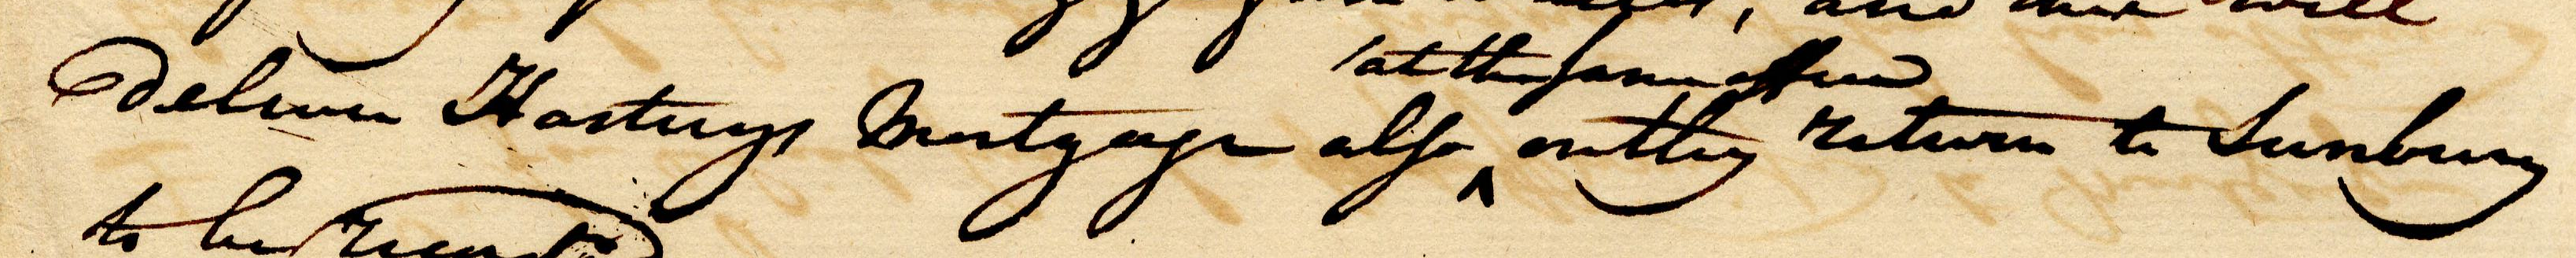deliver Hastings mortgage also ^ on thy return to Sunbury
